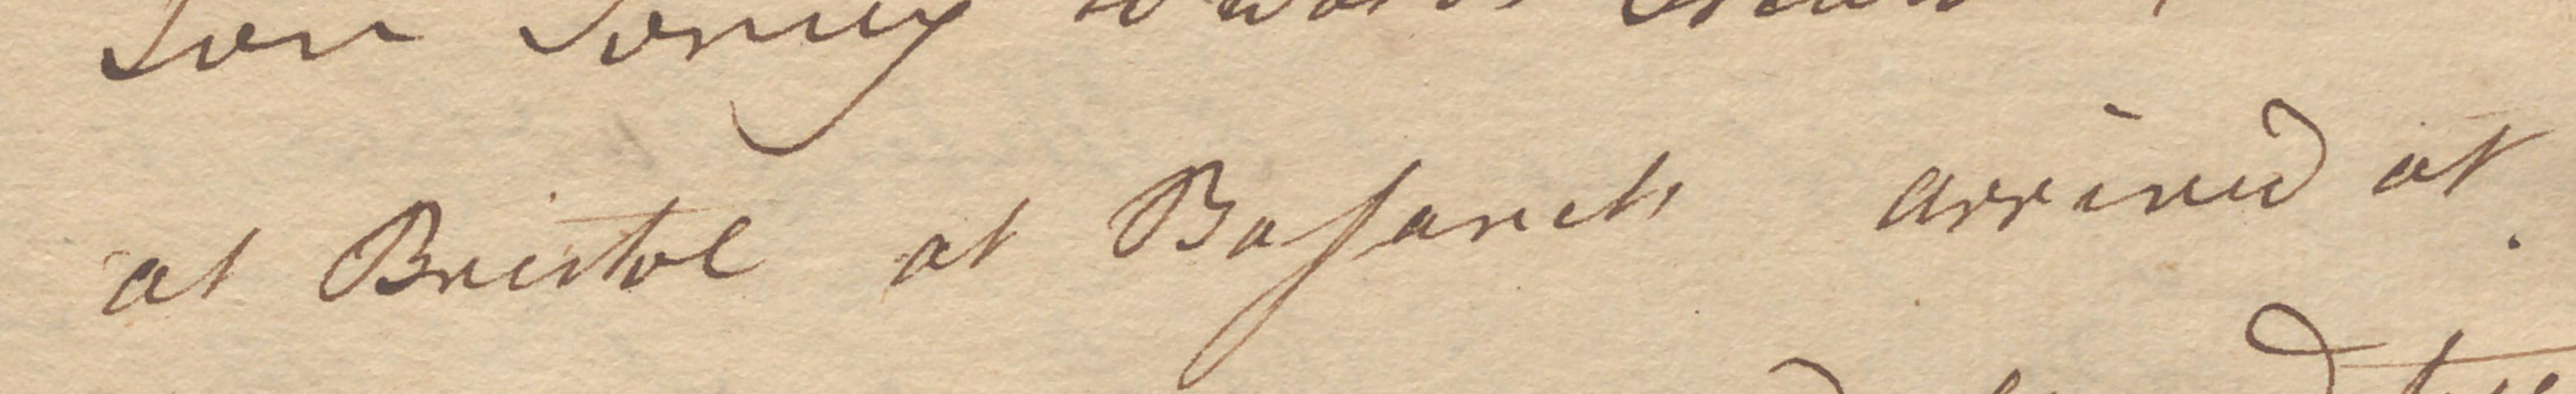at Bristol at Basanets arrived at
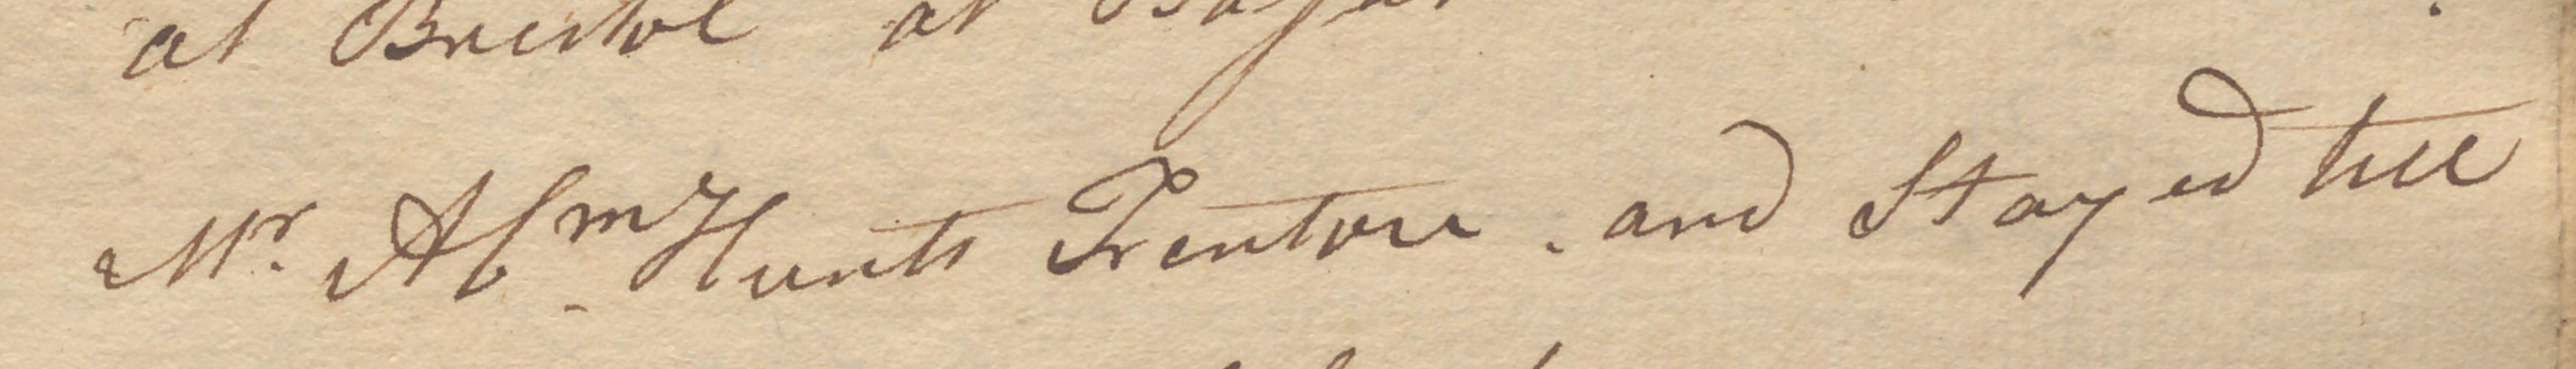M^r. Ab^m. Hunts Trenton and Stayed till
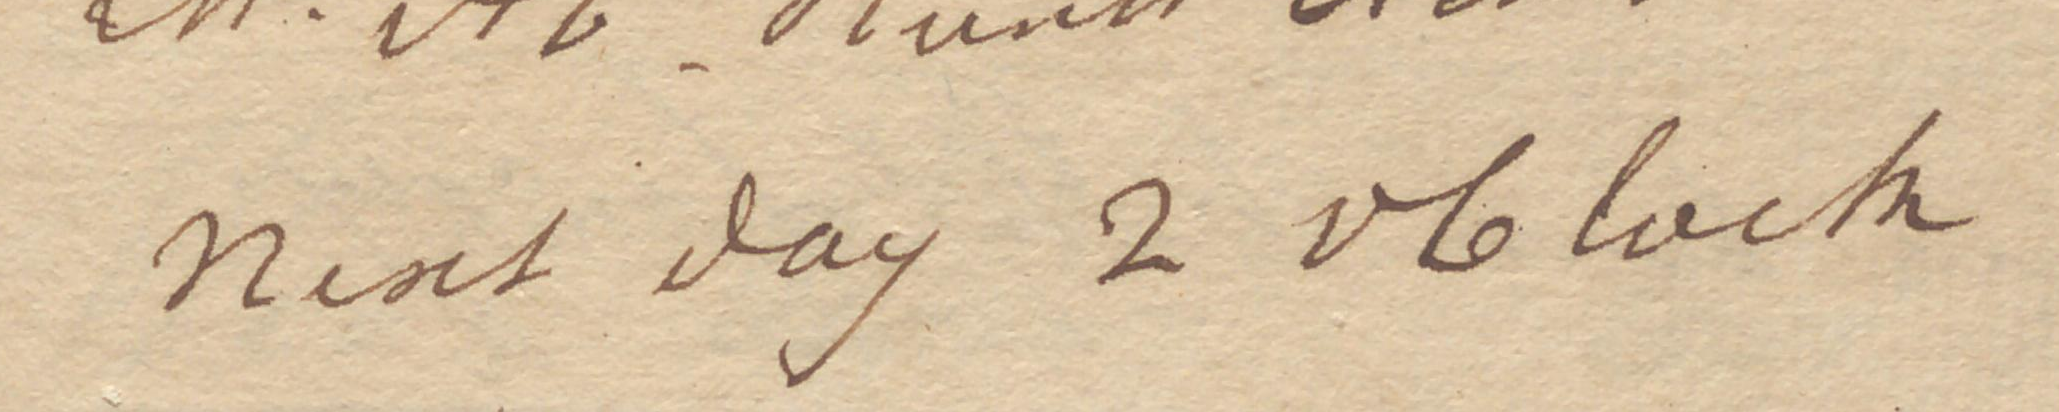Next day 2 oClock
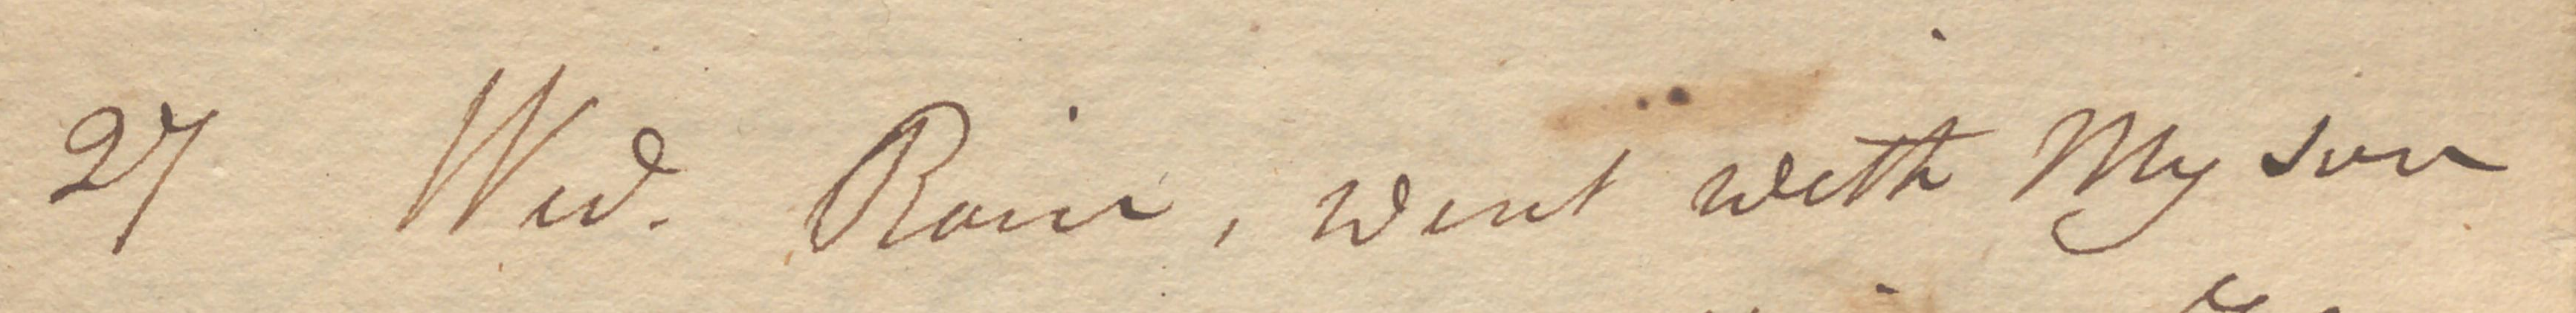27 Wed. Rain, went with My son
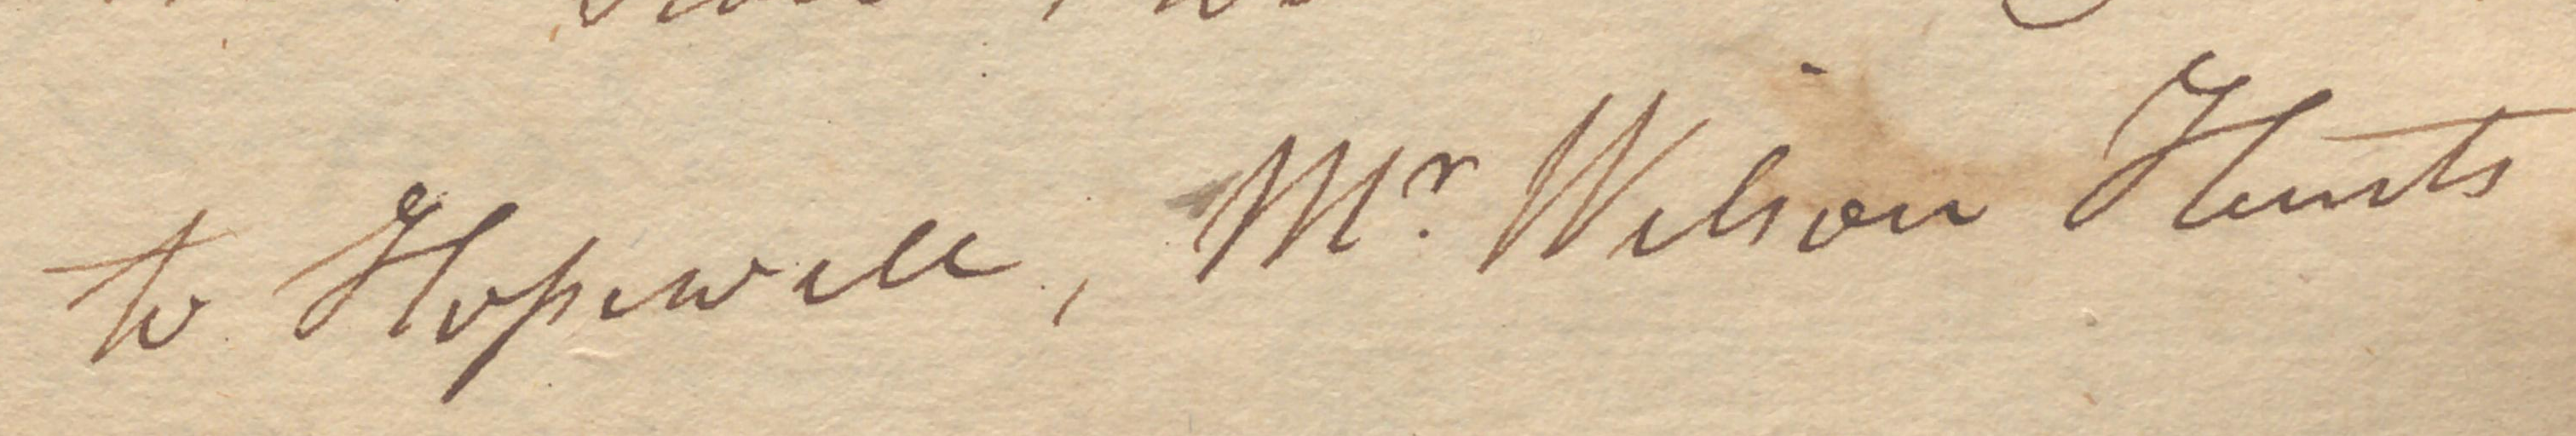to Hopewell, M^r. Wilson Hunts
